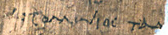απολλωνιοϲταδ
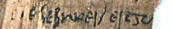ενεβεβηκεινειϲπλοιον
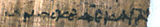γινωϲκεδεκαια
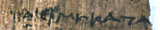αιειμηκατα
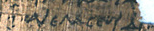ανελαϲϲονδικα
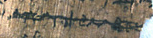απαγγελλετω
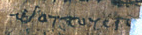μενουτουϲπ
